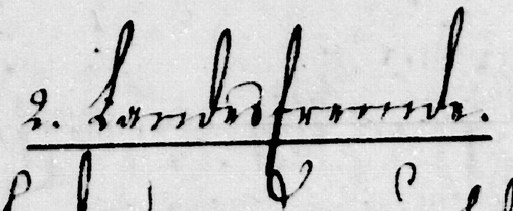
2. Landesfremde.
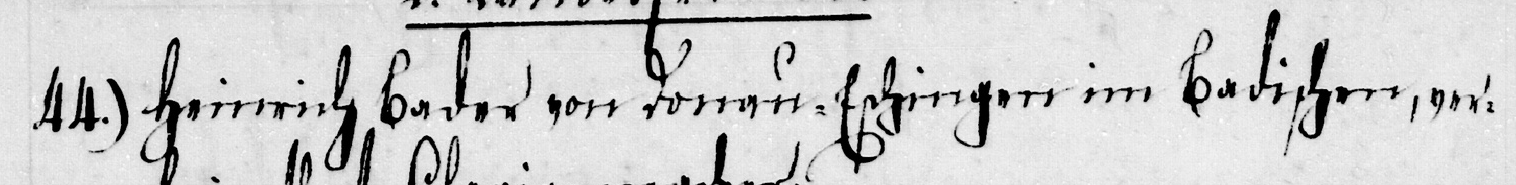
44.) Heinrich Bader von Donau-Eschingen im Badischen, ver¬
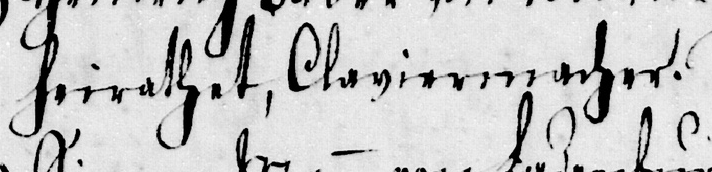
heirathet, Claviermacher.
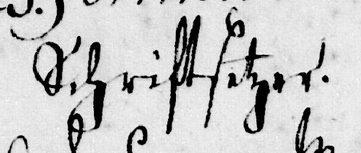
Schriftsetzer.
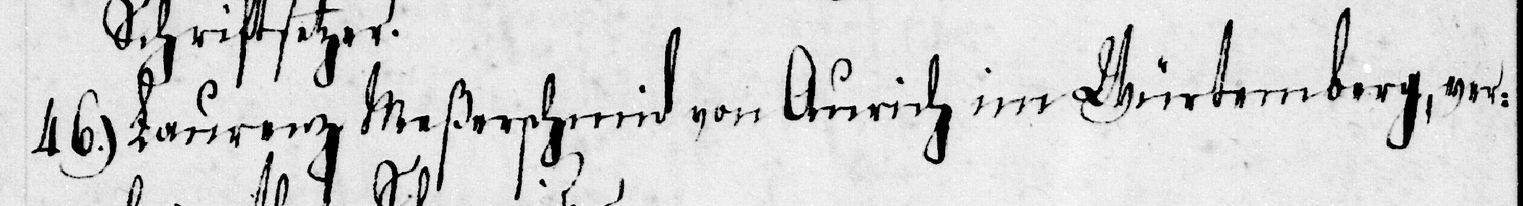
46.) Laurenz Meßerschmid von Aurich im Würtemberg, ver¬
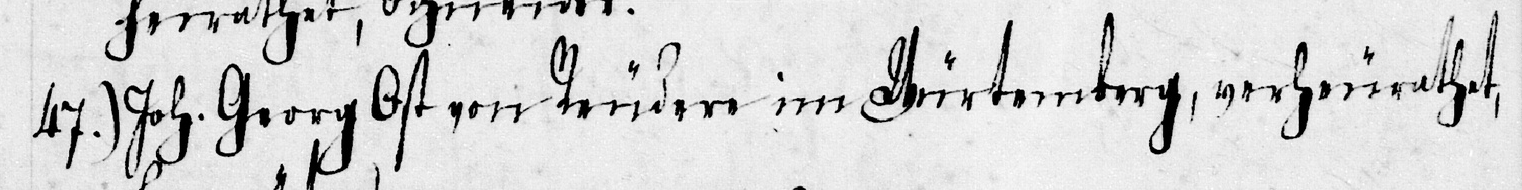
47.) Joh. Georg Ost von Reudere im Würtemberg, verheurathet,
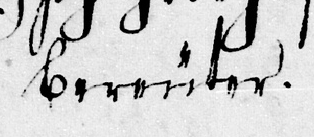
Bereuter.
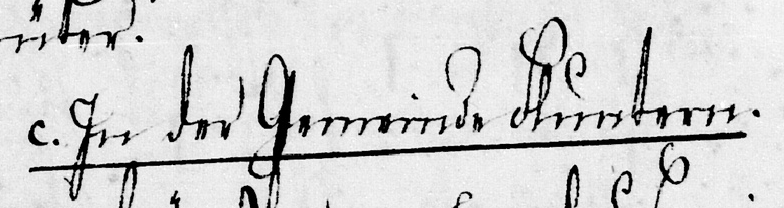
c. In der Gemeinde Fluntern.
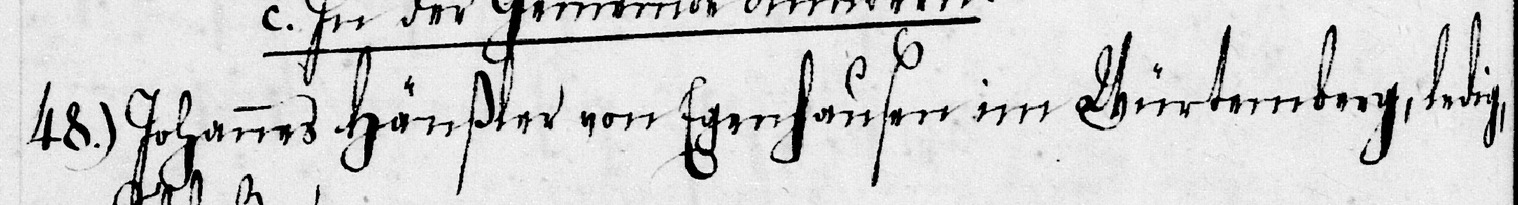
48.) Johannes Häußler von Egenhausen im Würtemberg, ledi¬
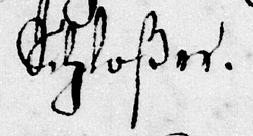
Schloßer.
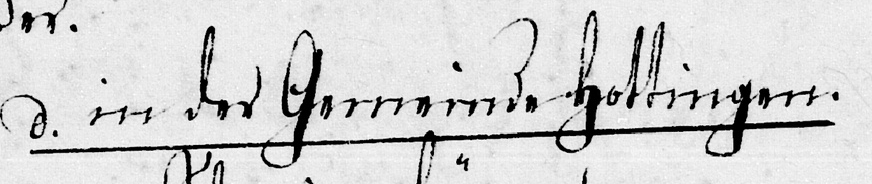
d. in der Gemeinde Hottingen.
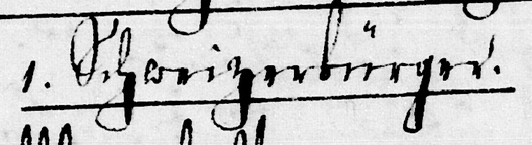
1. Schweizerbürger.
